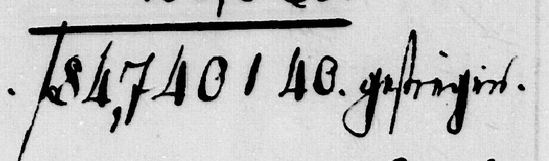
84, 740140. gestiegen.
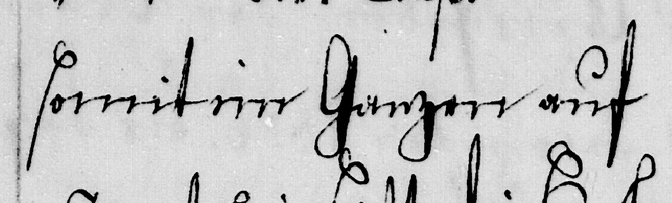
somit im Ganzen auf
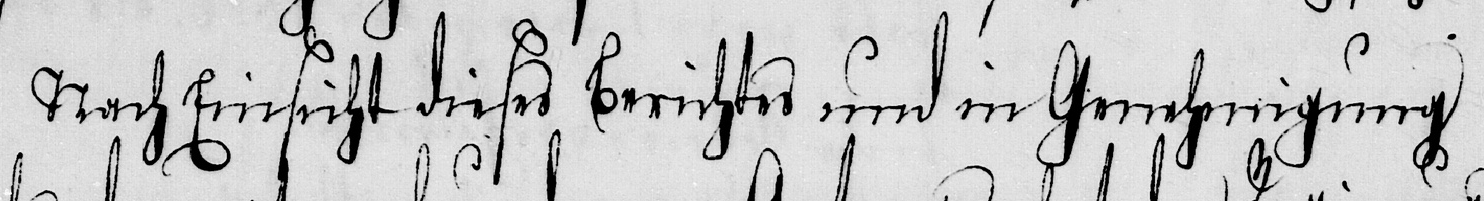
Nach Einsicht dieses Berichtes und in Genehmigung
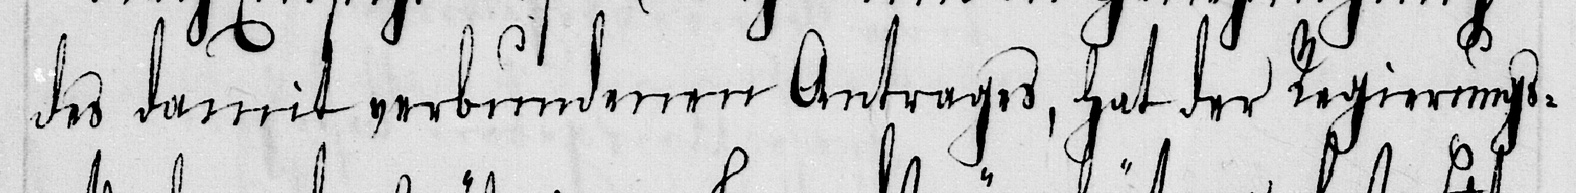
des damit verbundenen Antrages, hat der Regierungs¬
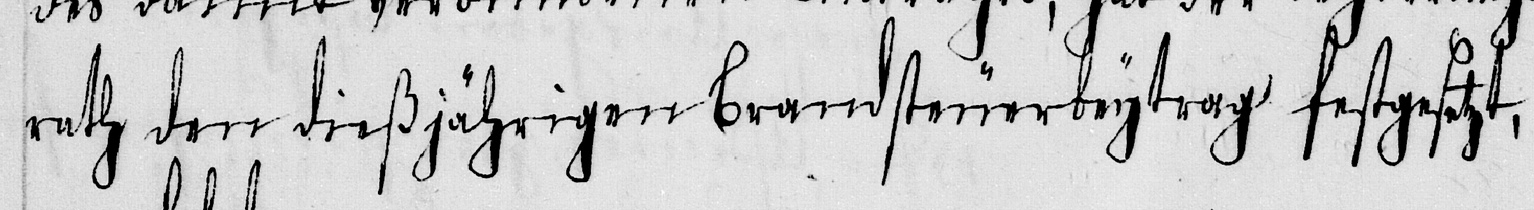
rath den dießjährigen Brandsteuerbeytrag festgesetzt,
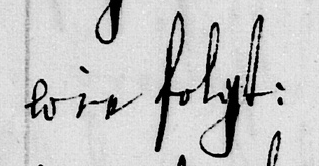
wie folgt:
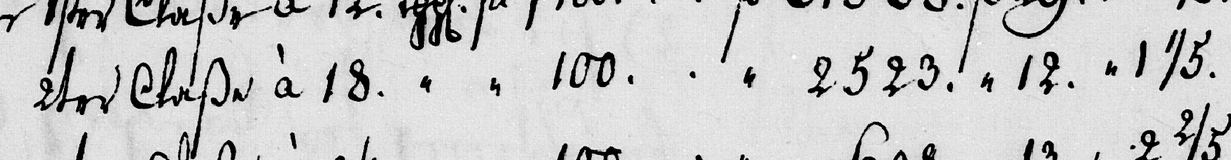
2ter Claße à 18. “ “ 100 “ 2523. “ 12. “ 1 1/5.
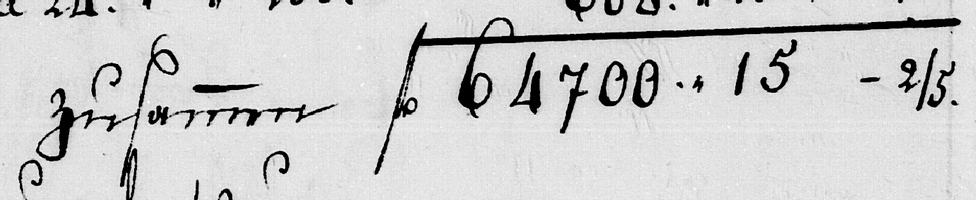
zusammen fl. 64700. “ 15 – 2/5.
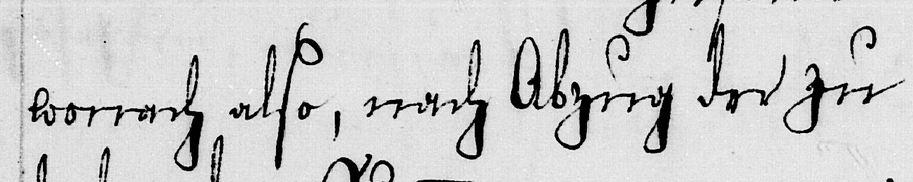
wonach also, nach Abzug der zu
